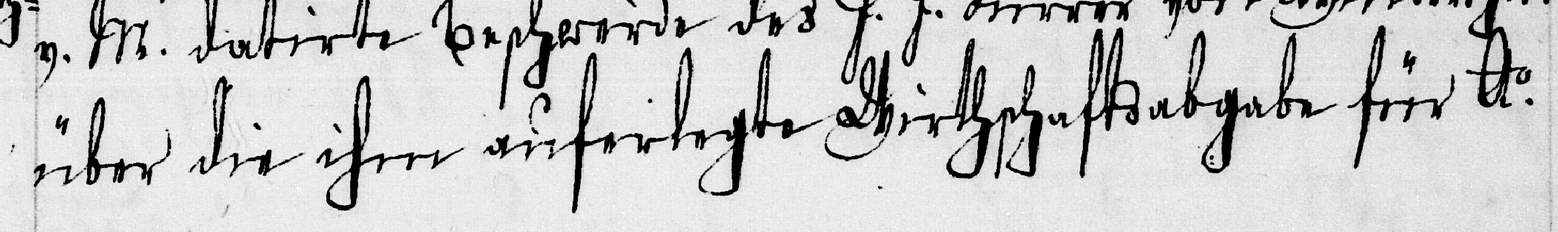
über die ihm auferlegte Wirthschaftsabgabe für Ao.
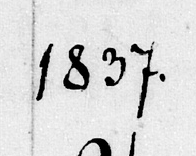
1837.
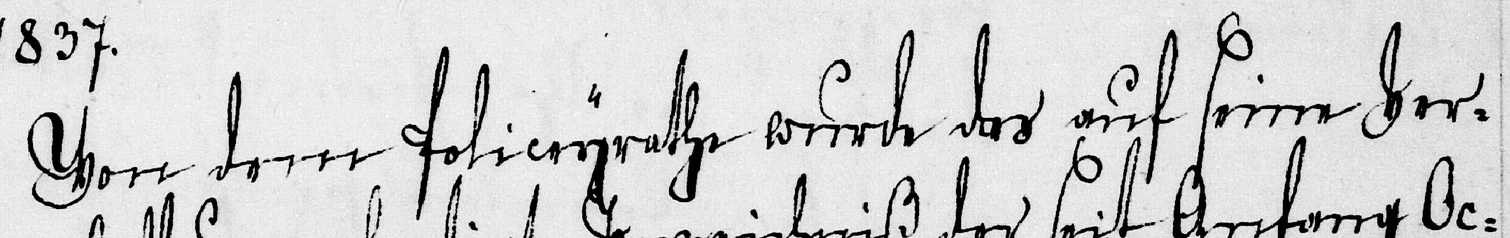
Von dem Policeyrathe wurde das auf seine Ver¬
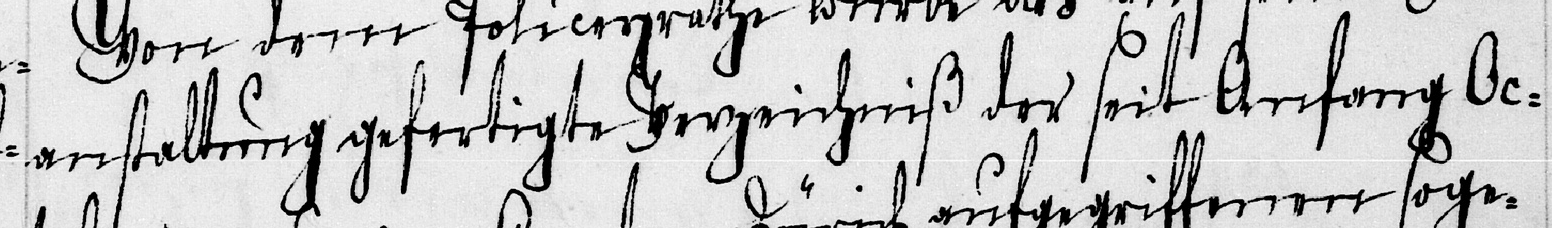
anstaltung gefertigte Verzeichniß der seit Anfang Oc¬
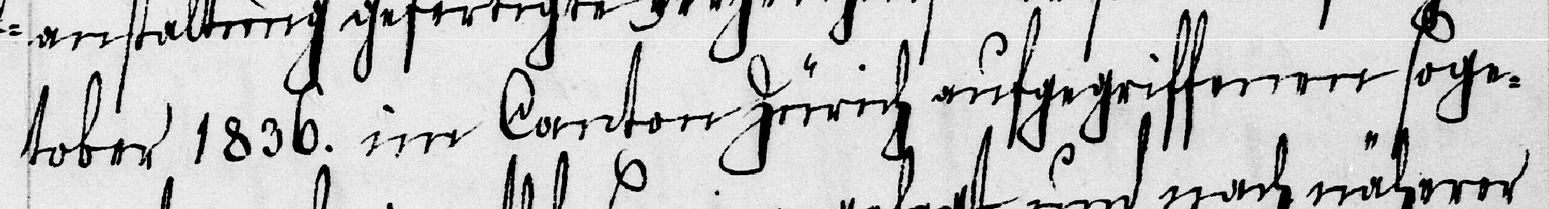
tober 1836. im Canton Zürich aufgegriffenen soge¬
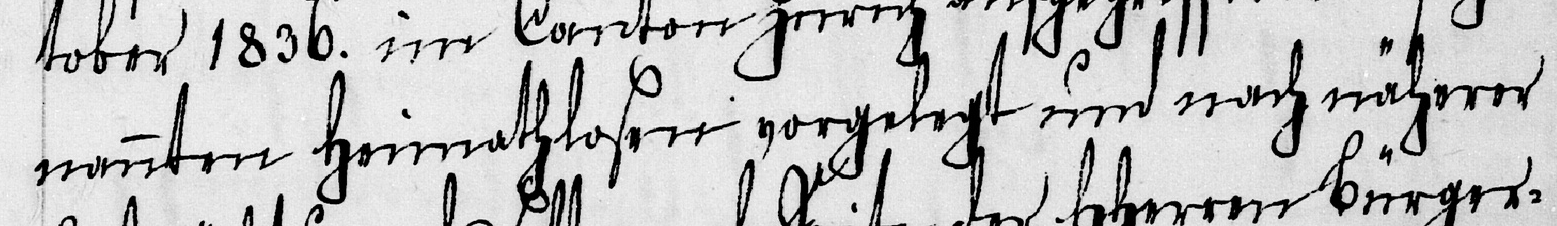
nannten Heimathlosen vorgelegt und nach näherer
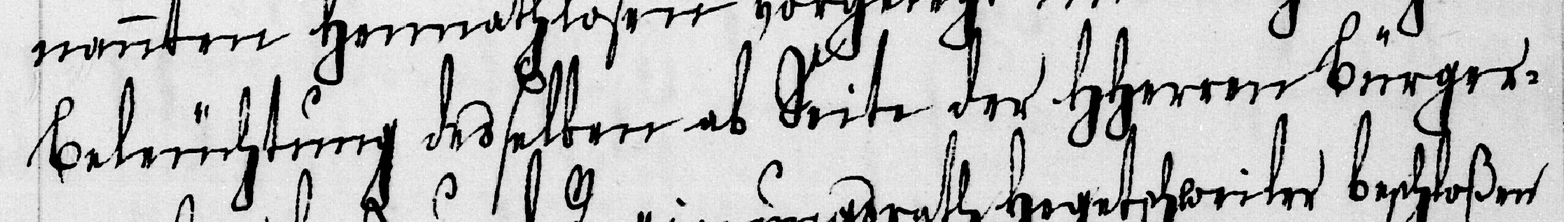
Beleuchtung desselben ab Seite der HHerren Bürger¬
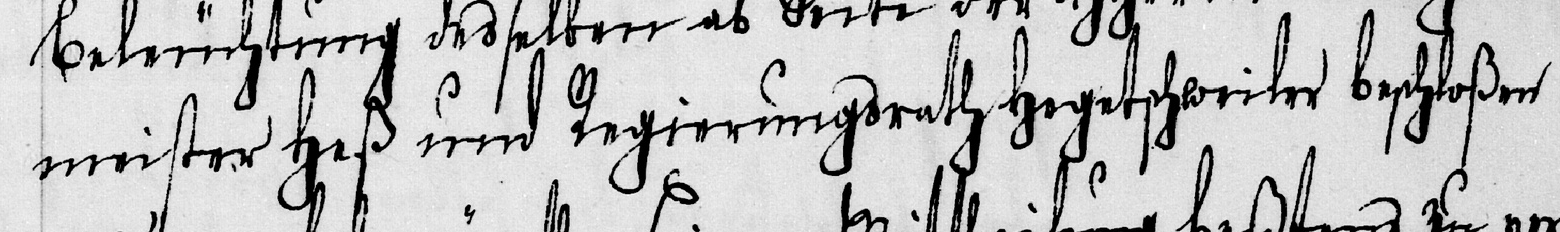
meister Heß und Regierungsrath Hegetschweiler
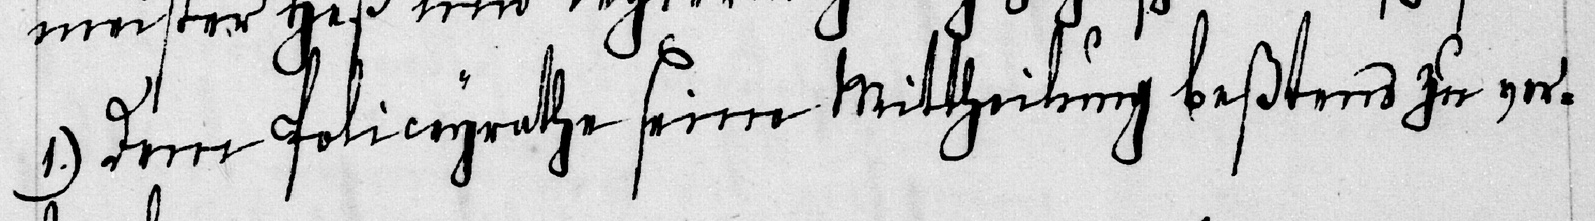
1.) Dem Policeyrathe seine Mittheilung beßtens zu ver¬
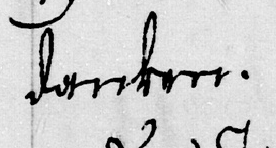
danken.
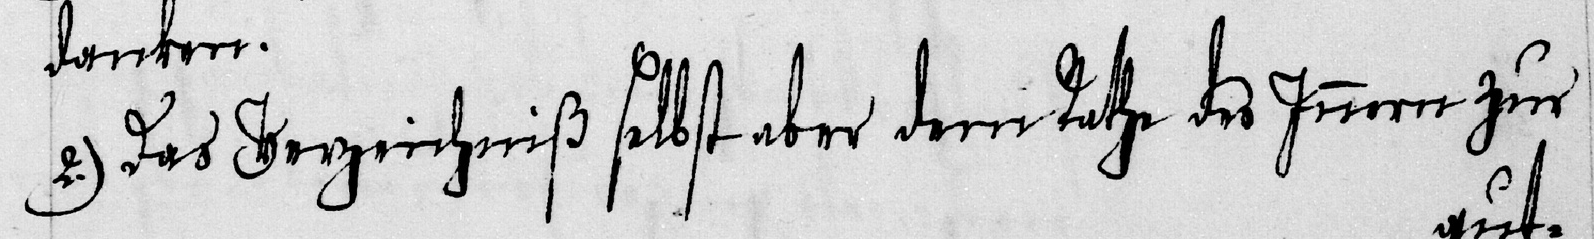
2.) Das Verzeichniß selbst aber dem Rathe des Innern zur
